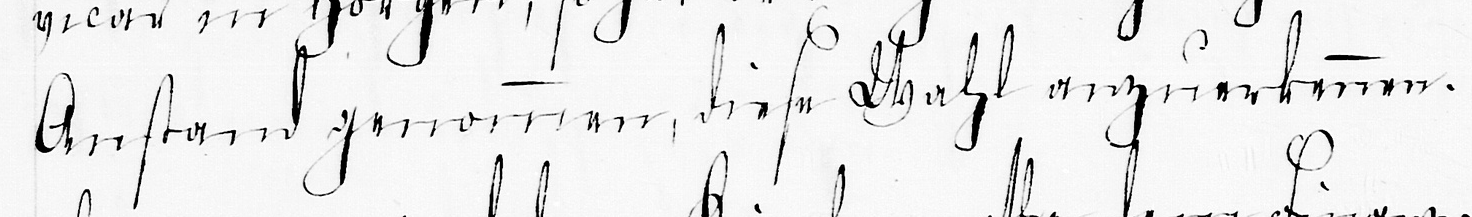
Anstand genommen, diese Wahl anzuerkennen.
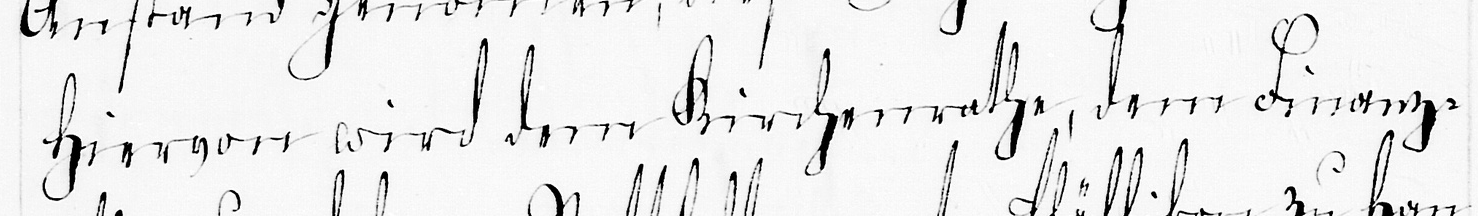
Hiervon wird dem Kirchenrathe, dem Finanz¬
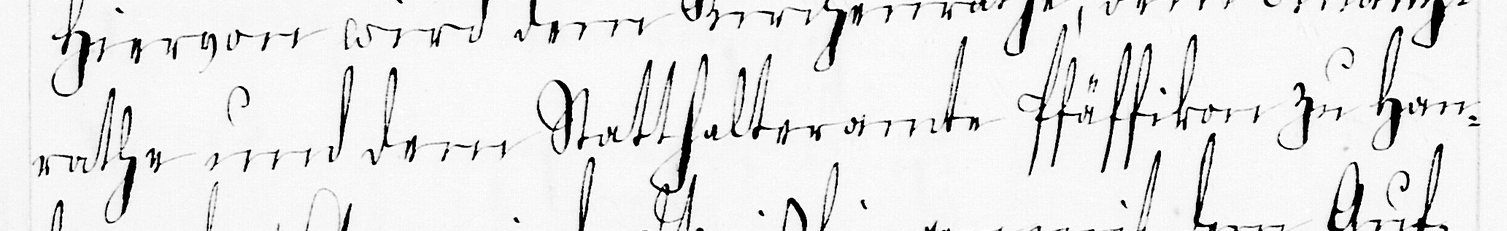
rathe und dem Statthalteramte Pfäffikon zu Han¬
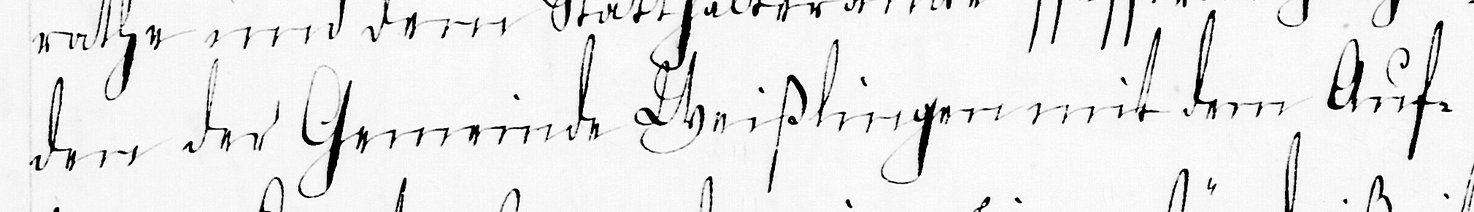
den der Gemeinde Weißlingen mit dem Auf¬
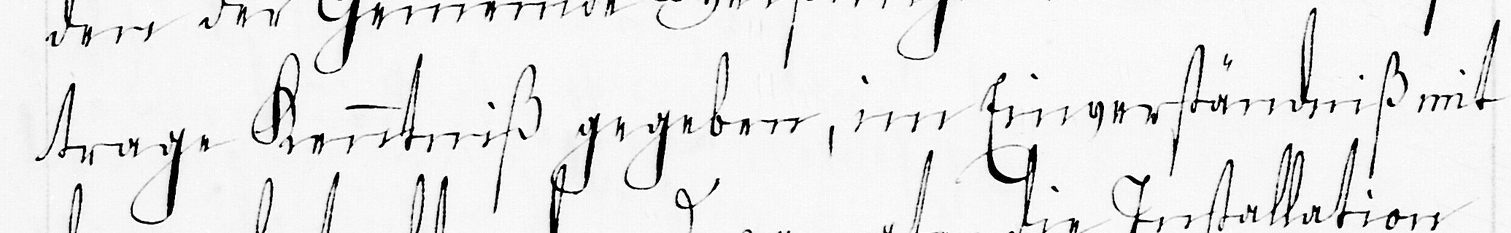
trage Kenntniß gegeben, im Einverständniß mit
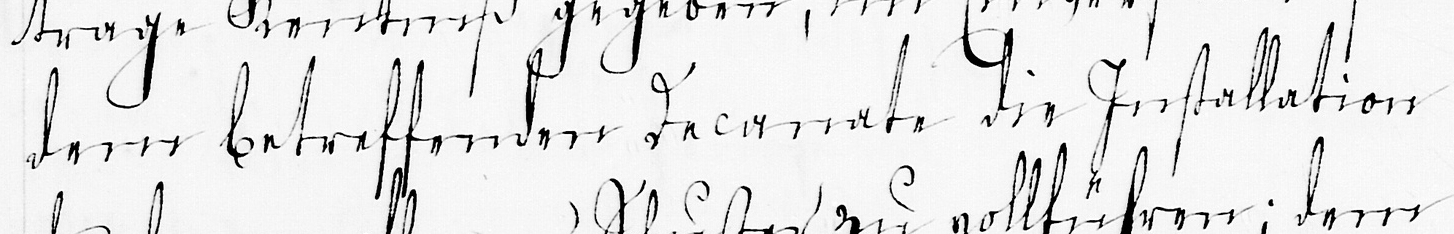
dem betreffenden Decanate die Installation
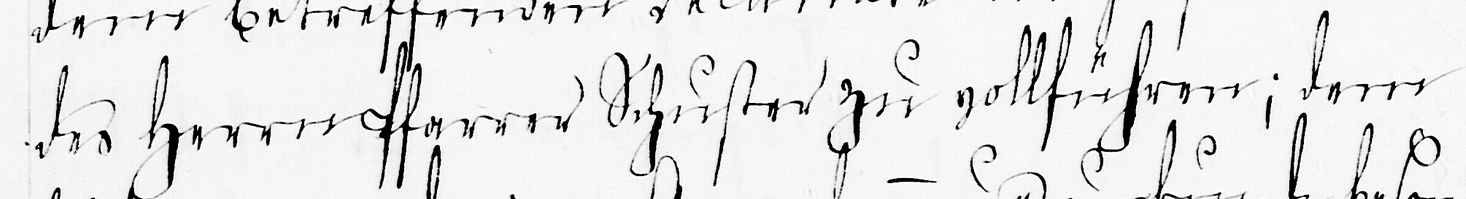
des Herrn Pfarrer Schuster zu vollführen; dem
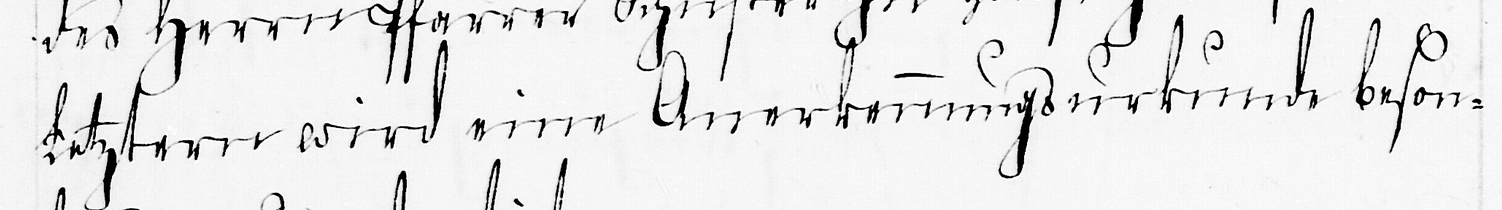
Letztern wird eine Anerkennungsurkunde beson¬
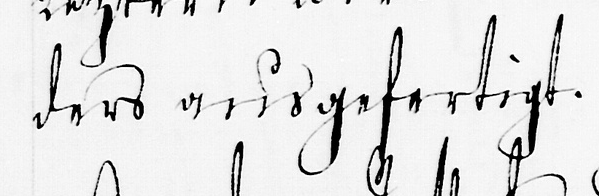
ders ausgefertigt.
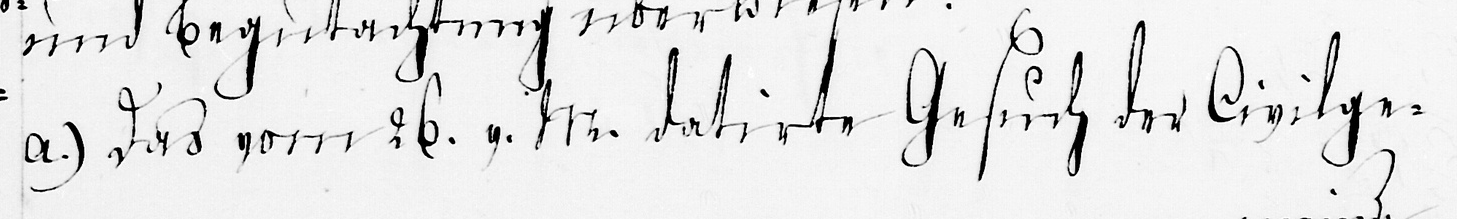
a.) Das vom 26. v. M. datirte Gesuch der Civilge-
